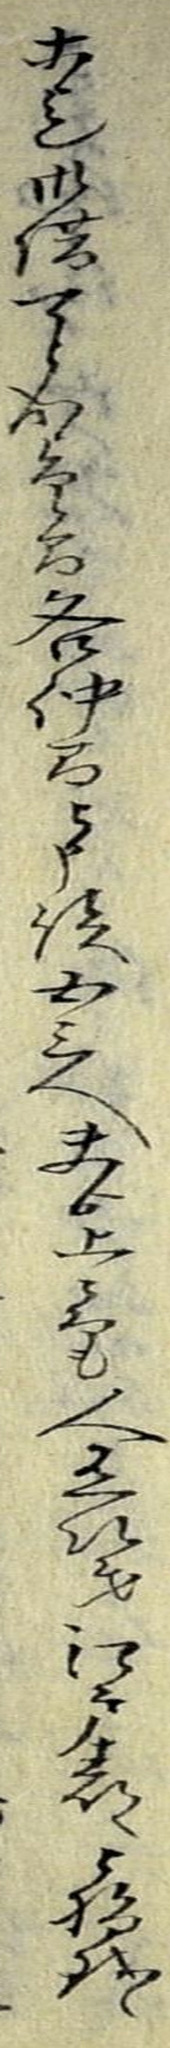等迄御借可被成旨候間各仲間被申談五三人夫ゟ上ニ而も人有次第江戸表へ被指越候
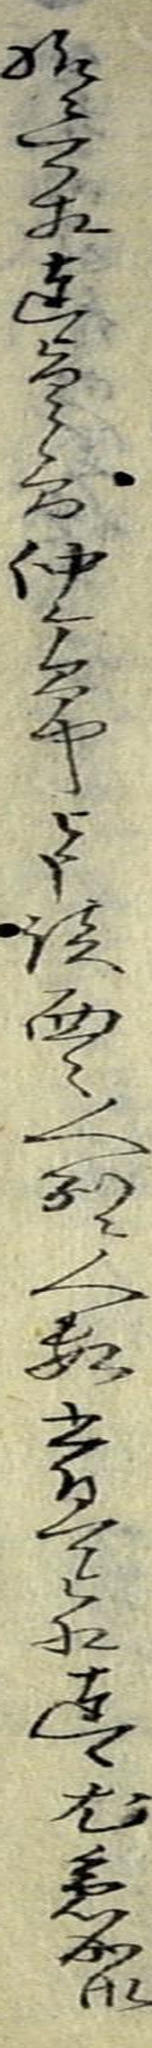様ニ可相達旨ニ候間仲ケ間中被申談面々人別ニ人数書付可被相達候尤急成御
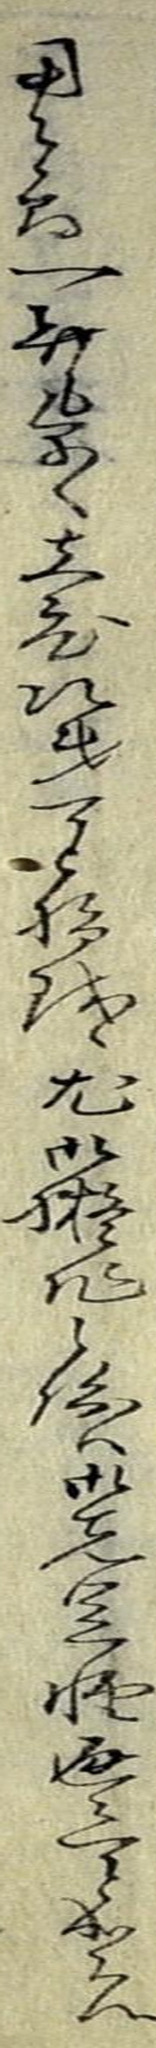用ニ候間一刻も早く支度次第可被指越候尤御擬作之儀ハ御先足軽通ニ可被成下候
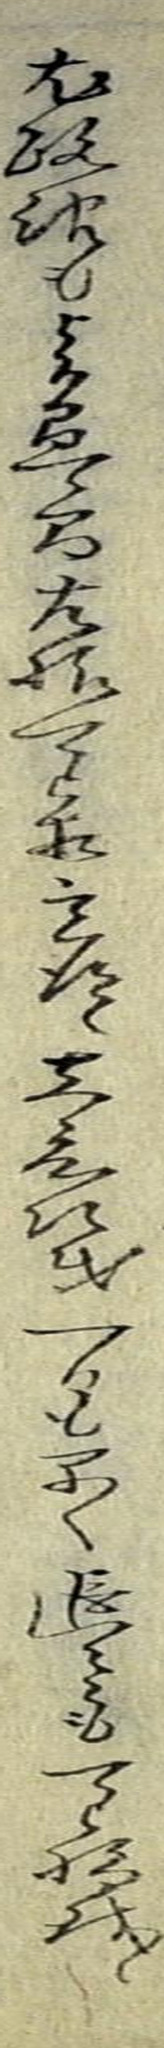尤路銀も被下置候間左様可被相意得候支度次第一日も早く追々ニも可被指越候
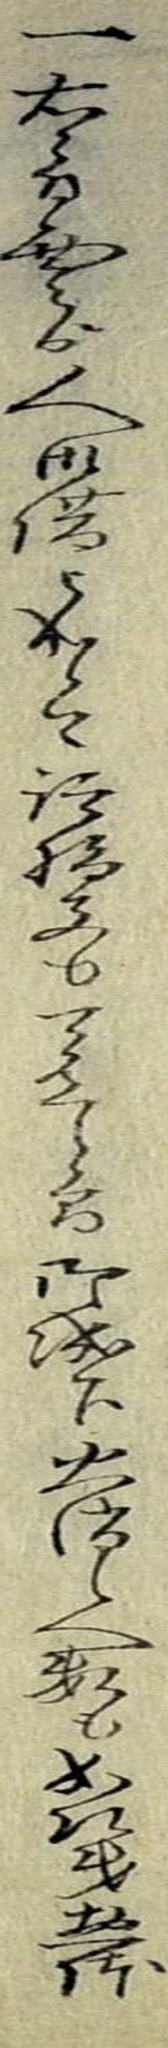一右ニ付面々ゟ人御借被成候ハヽ跡指支も可有之候間御城下火消之人数も成次第惣体
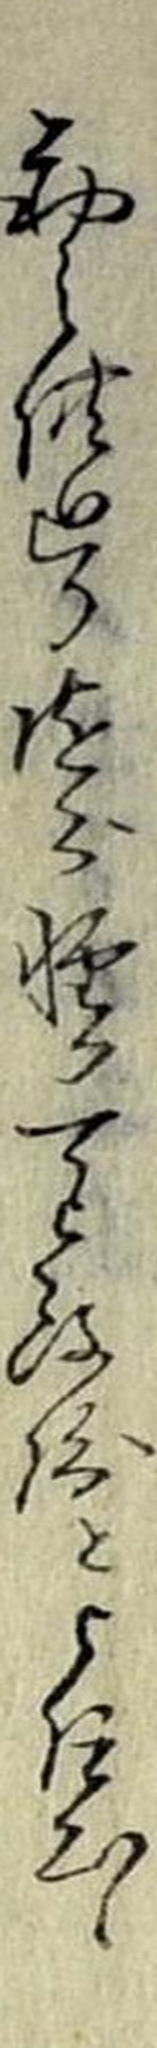勤之供廻り随分軽ク可被致と被仰出候
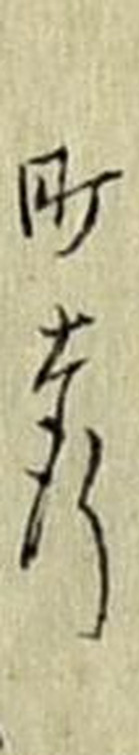町奉行
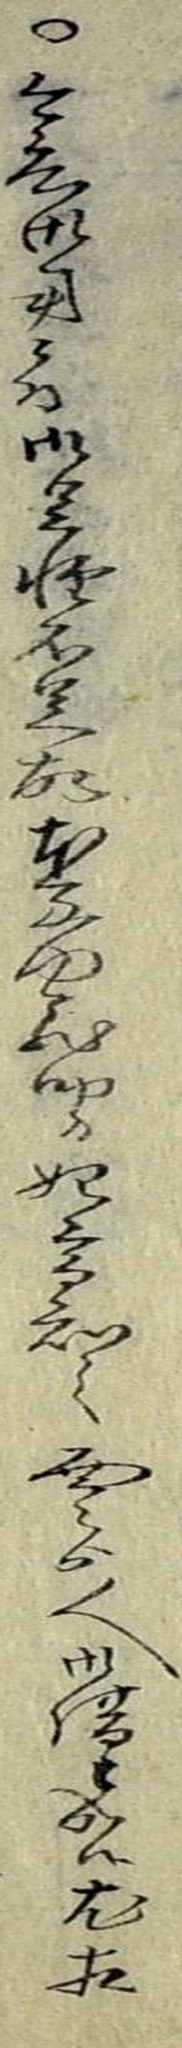〇今度御用ニ付御足軽不足故本多内蔵助方始高知之面々ゟ人御借被成候尤相
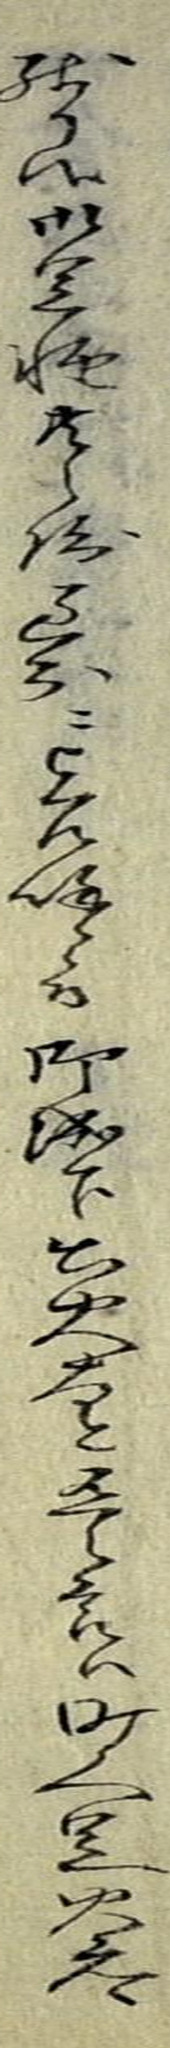残り候御足軽共之儀過分ニ被召呼候ニ付御城下出火なと有之節ハ町人足火元へ
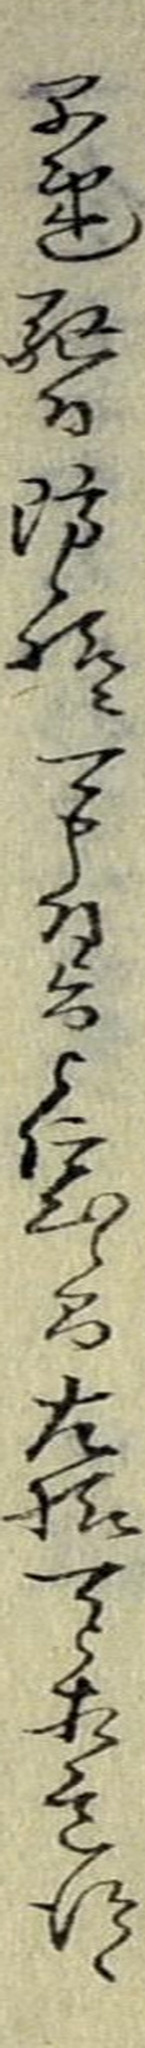早速駆付防候様ニ可申付旨被仰出候間左様可被相意得候
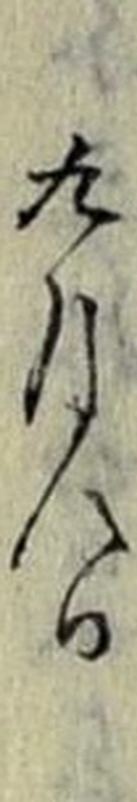九月八日
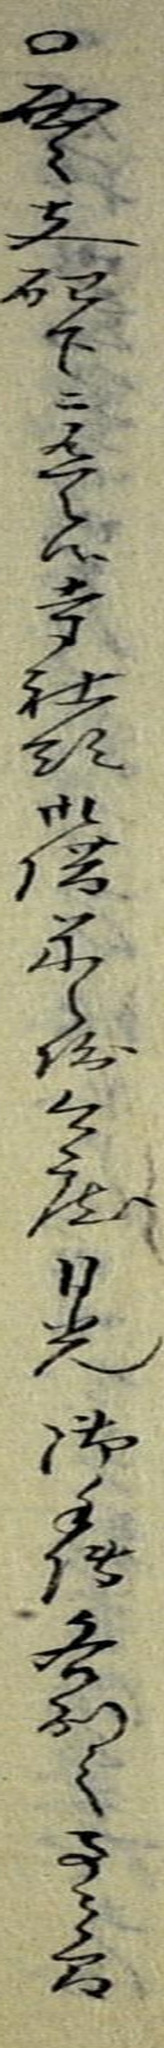〇面々支配下ニ有之候寺社領御借米之儀今度日光御手伝各別之事ニ候間
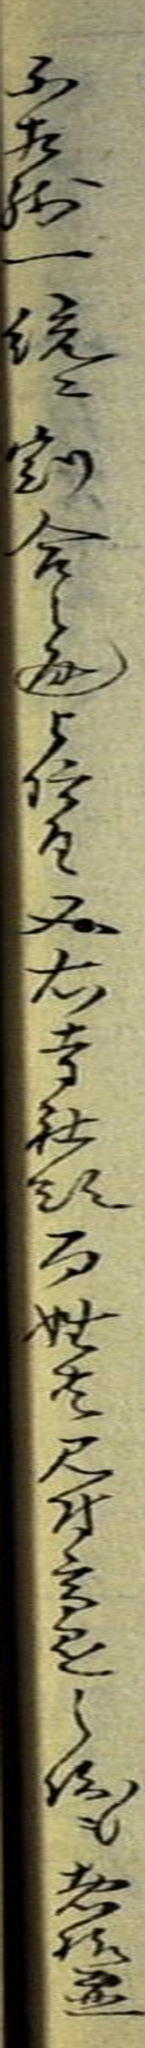不相残一統ニ割合之通被仰付候又右寺社領百姓共見付高懸之儀も惣様並
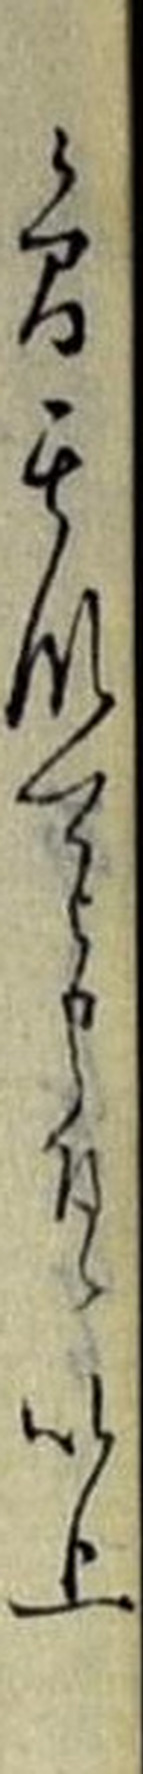候間其段可被申付候以上
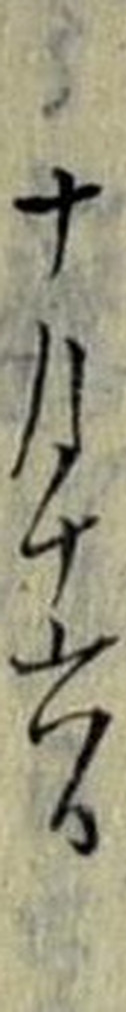十月十六日
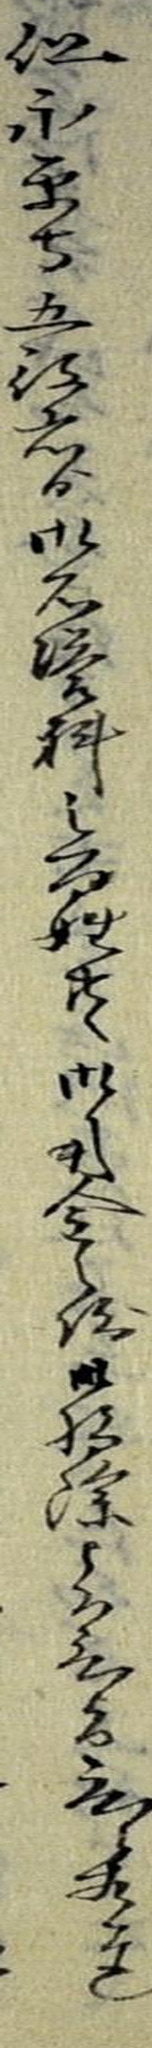但永平寺五役者ゟ御石塔料之百姓共へ御用金之儀御指除被下度旨度々相達
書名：命令之部 一
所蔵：福井県文書館 Fukui Prefectural Archives
